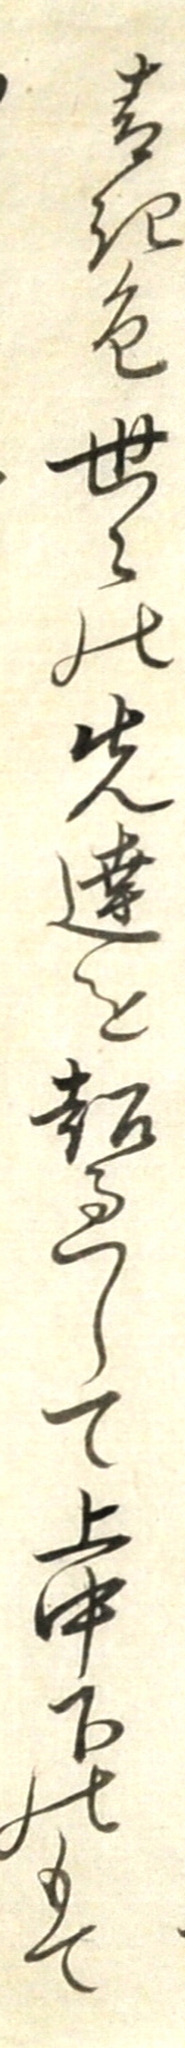青き色世々の先達を超過して上中下のもて
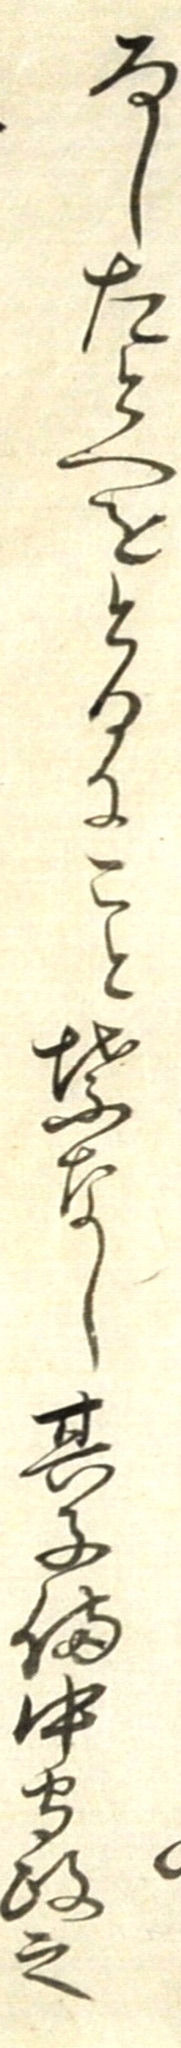なしたとへをとるにこと葉なし其子備中守政之
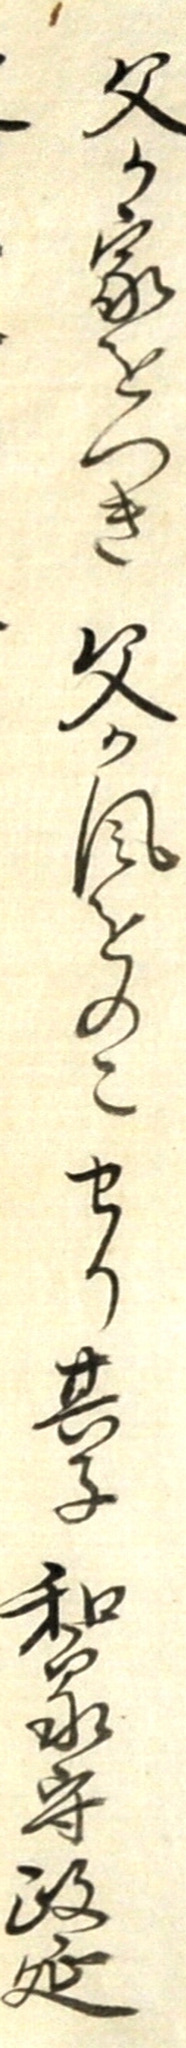父か家をつき父か風をのこせり其子和泉守政延
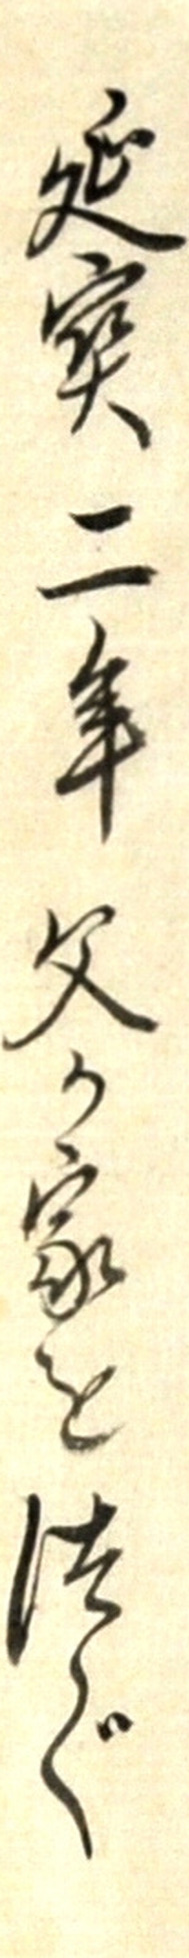延宝二年父か家をつぐ
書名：藩翰譜（六）
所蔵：伊那市立高遠町図書館・合同会社AMANE
